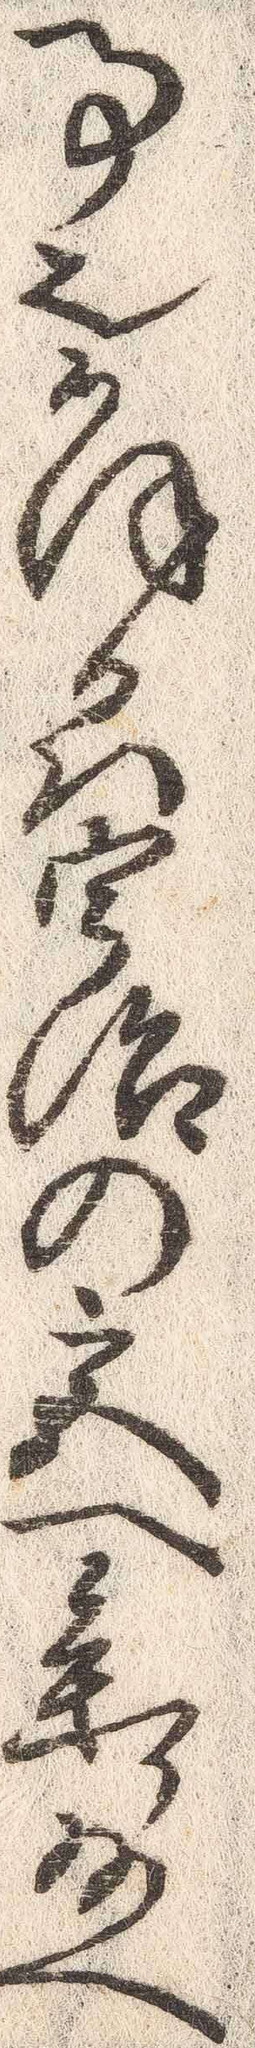事也かほるは宇治の宮へ参り給へ
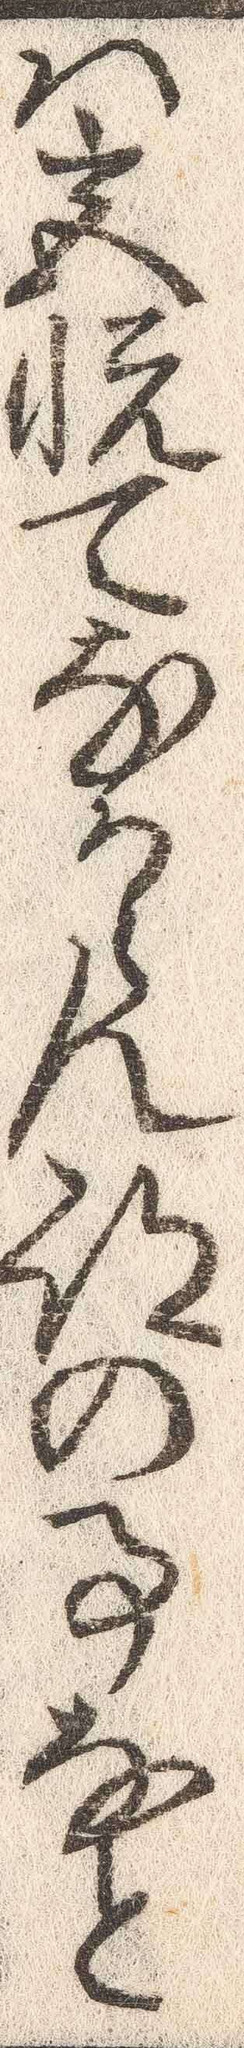は宮悦てなからん跡の事なと
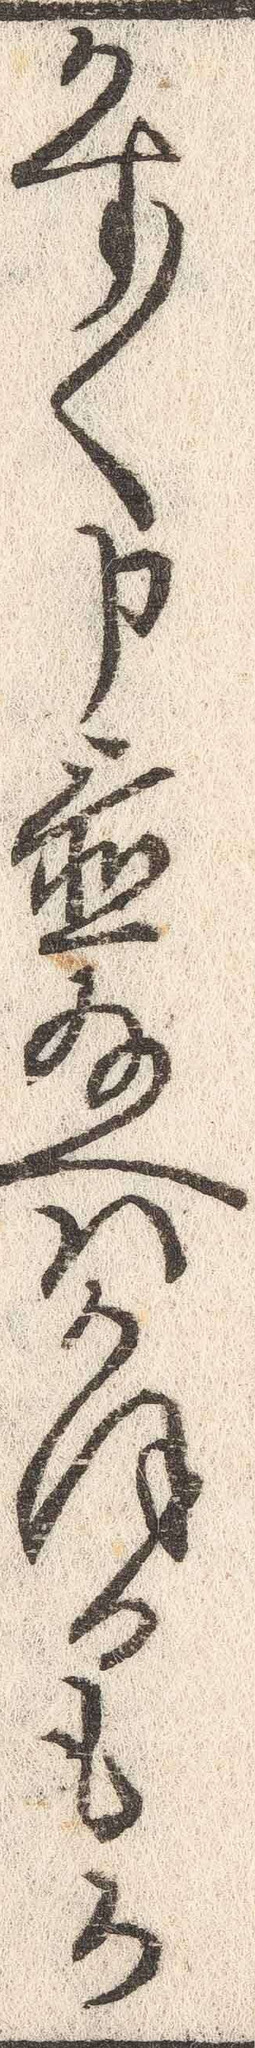かす〳〵申置給へはかほるもか
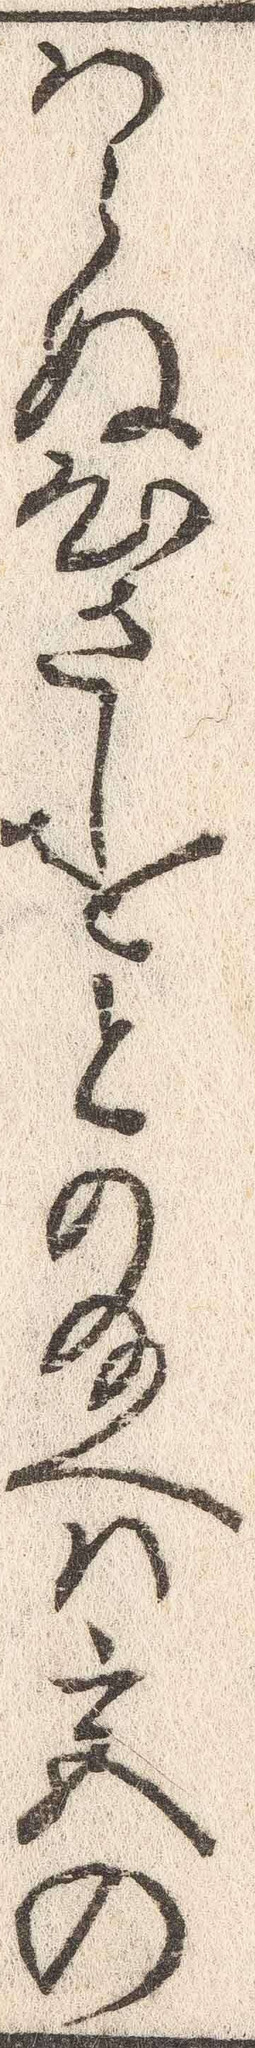はらぬ心さしをとの給へは宮の
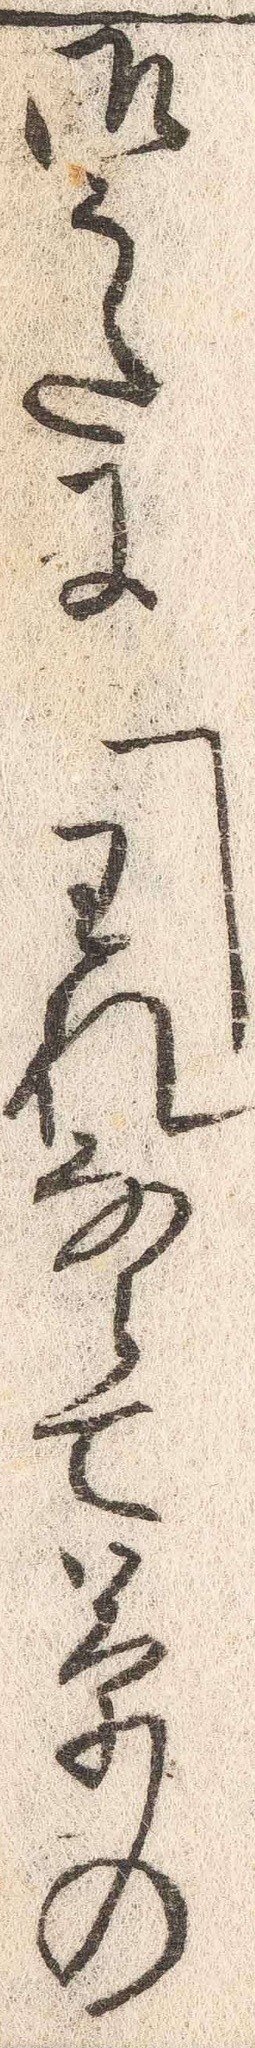御かたに〽︎われならて草の

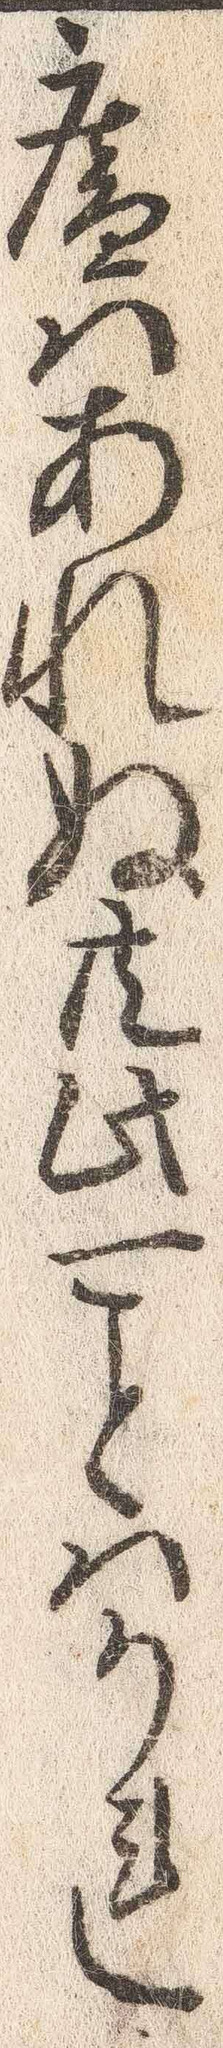廬はあれぬ共此一ことはかれ
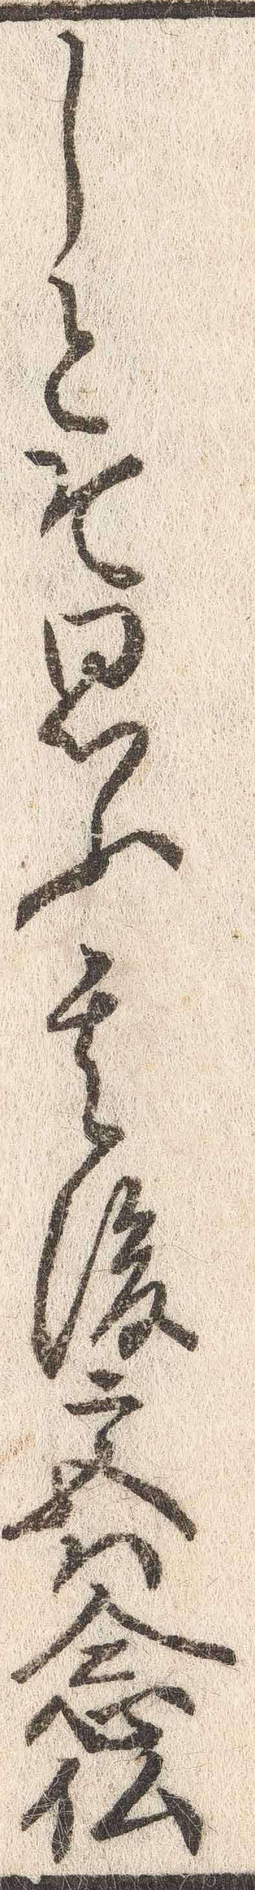しとそ思ふ其後宮は念仏
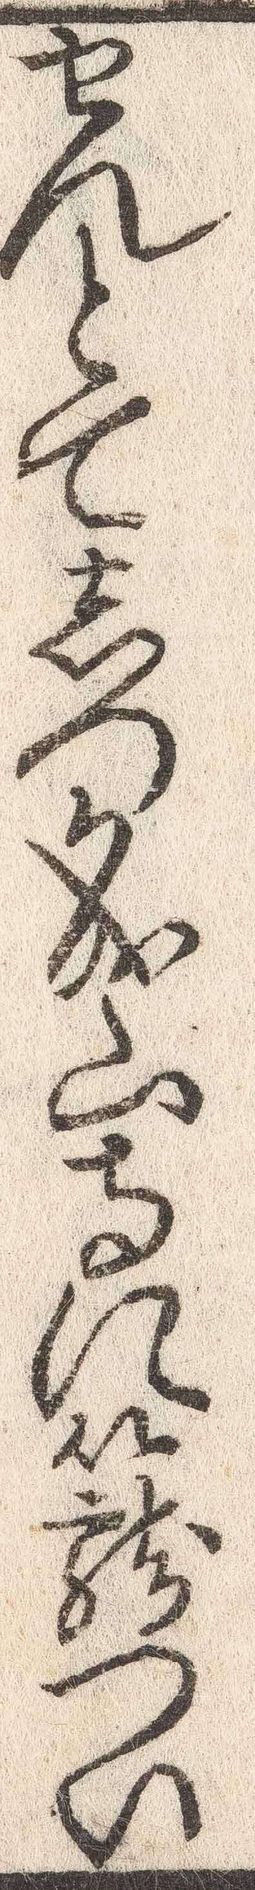せんとてしつか成山寺に籠つい
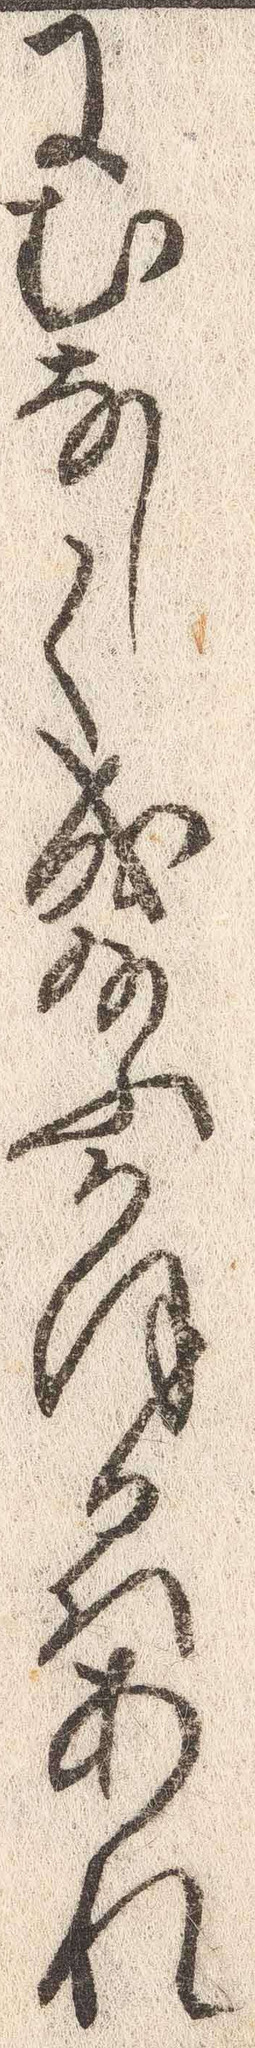にむなしく成給ふかほるはあれ
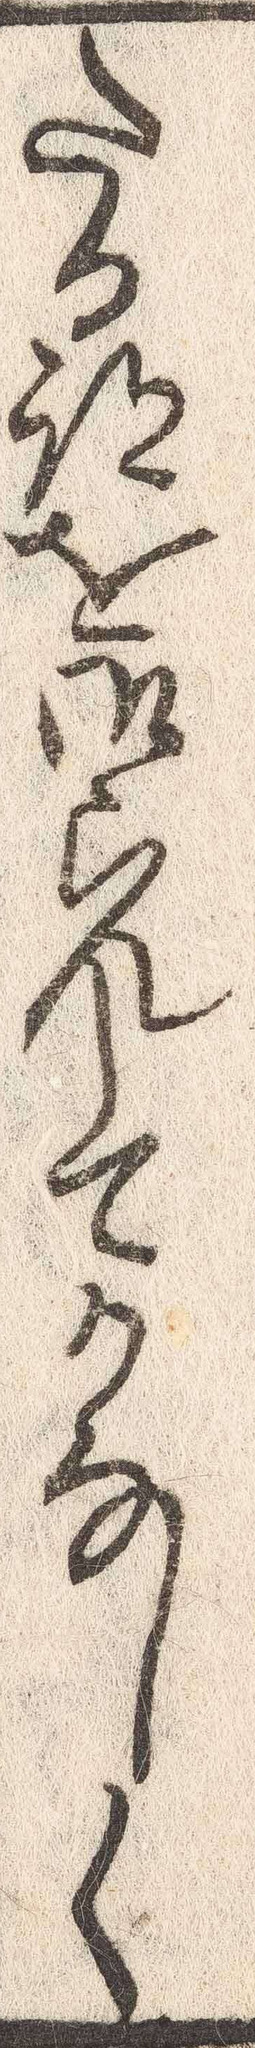たる跡を御らんしてかなしく
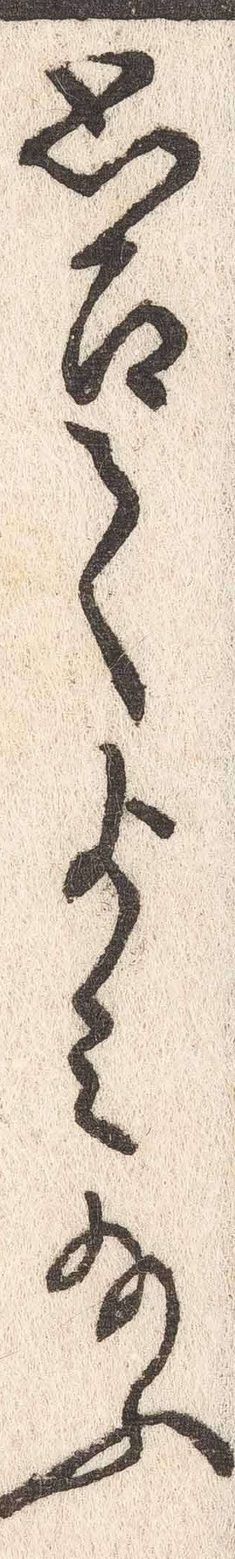思召てよみ給ふ
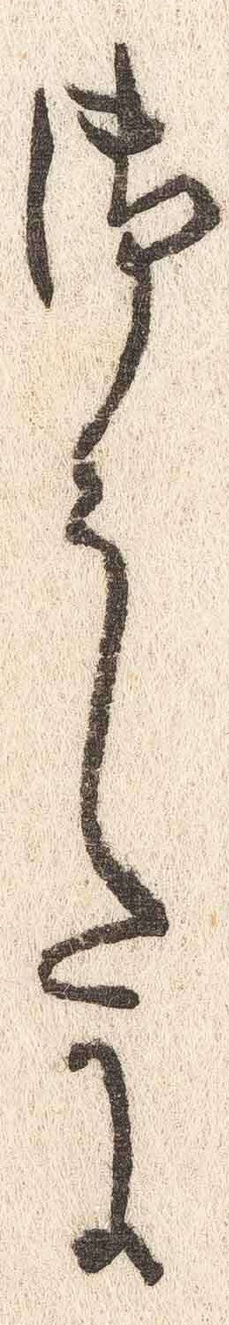御うたに
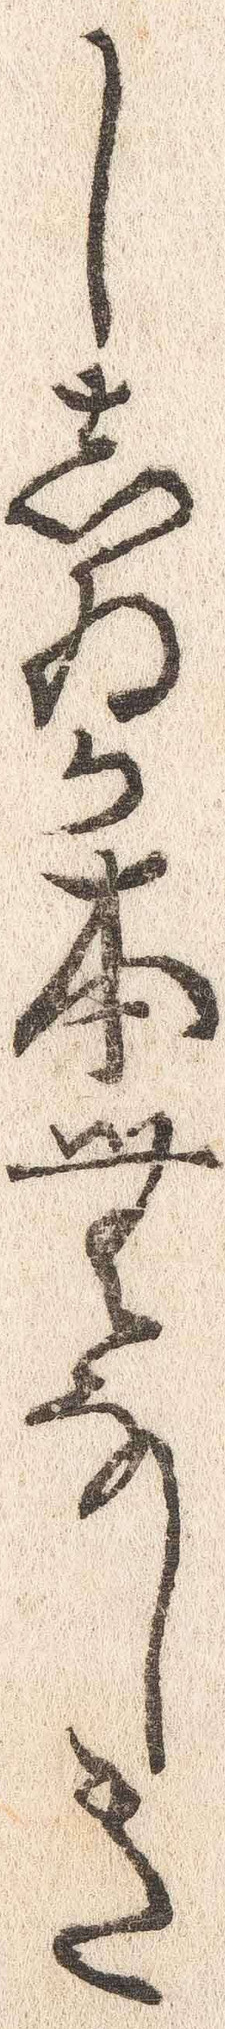ししゐか本むなしき
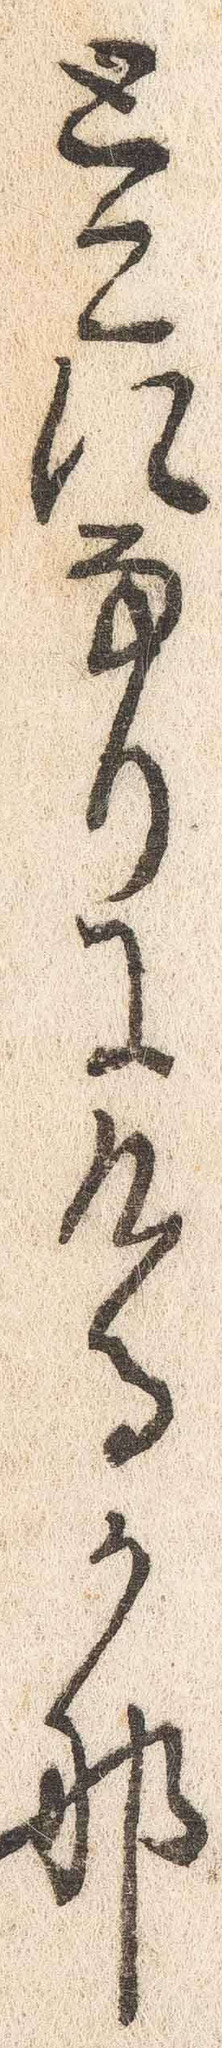とこになりにけるかな

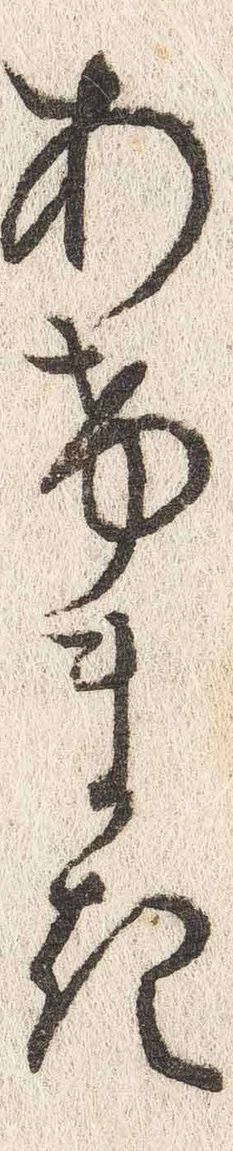あけまき
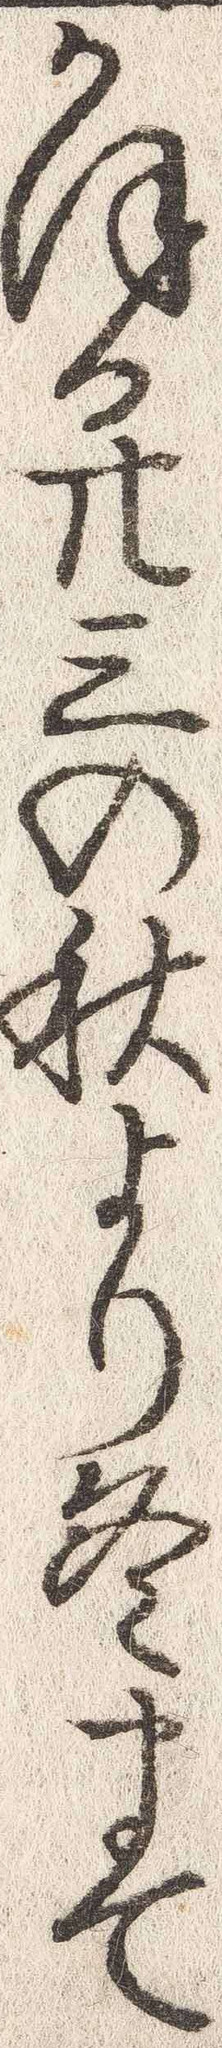かほる廿三の秋より冬まて
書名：源氏物語
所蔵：東京学芸大学附属図書館 国文学研究資料館
